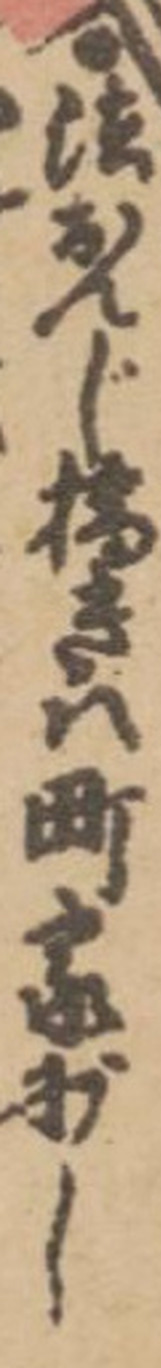●法おんじ橋きは町家少し
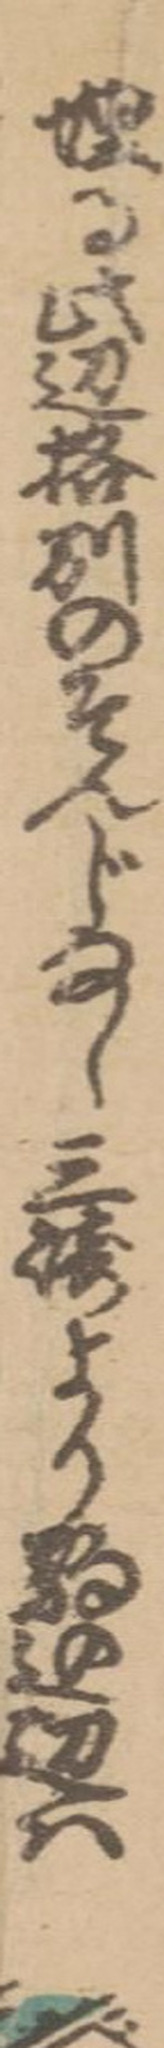埋る此辺格別のそんじなし三崎より駒込辺は
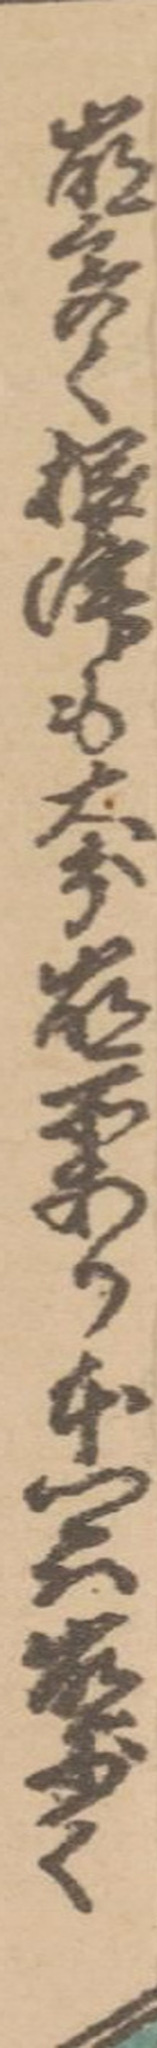崩多く根津も大分崩所あり本郷は崩少く
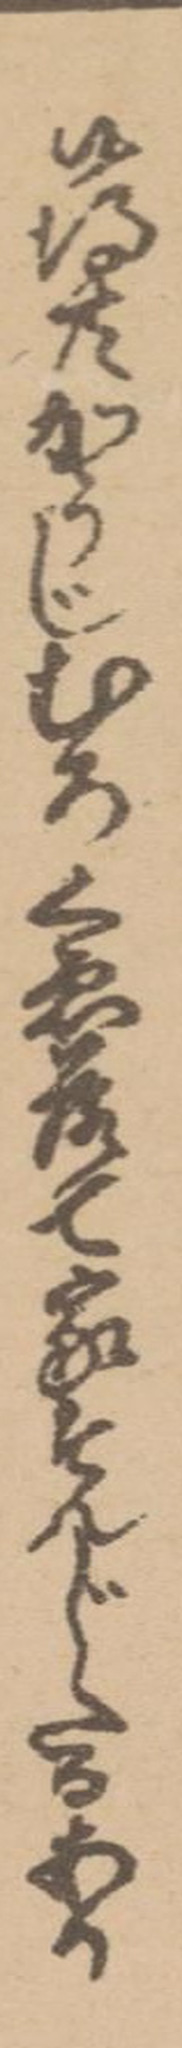候得共かうじむろく焦落て家そんじたるあり
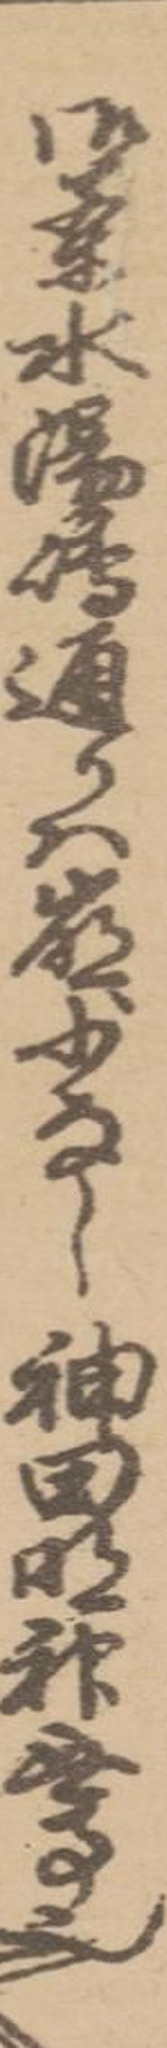御茶水湯島通りは崩少なし神田明神無事也
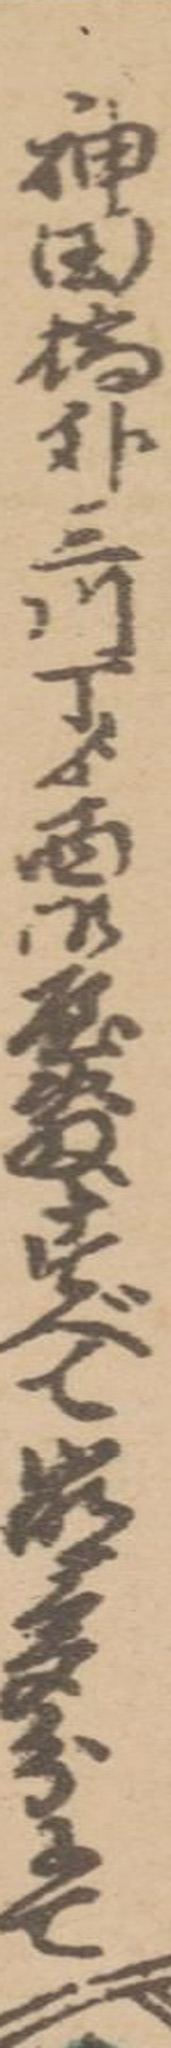神田橋外三川丁ゟ西御屋敷すべて崩多分にて
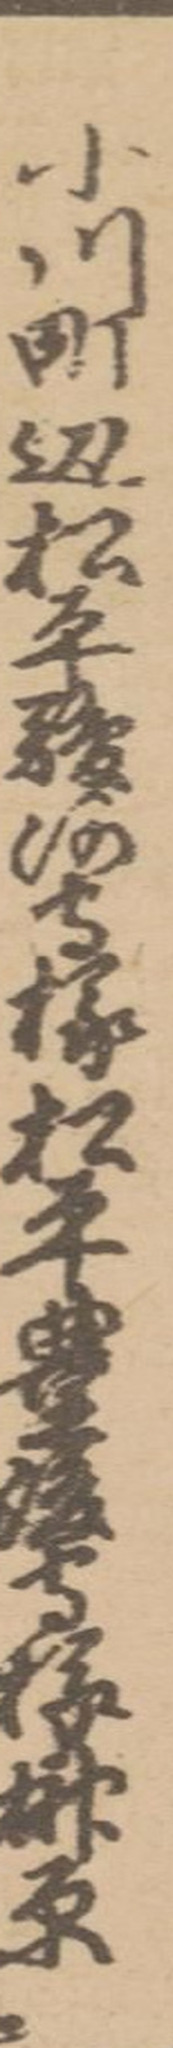小川町辺松平駿河守様松平豊後守様榊原
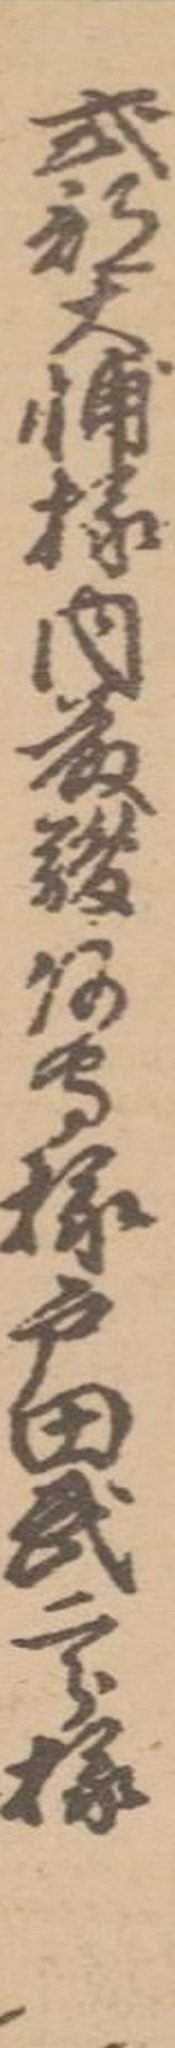式部大輔様内藤駿河守様戸田武二郎様
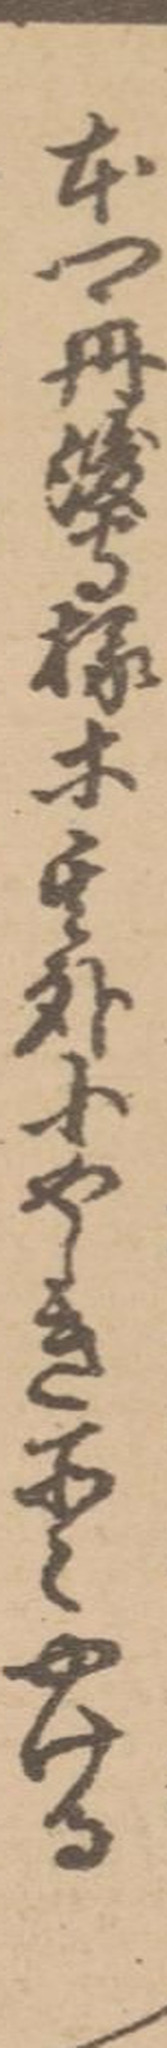本郷丹波守様等其外小やしき所々やける
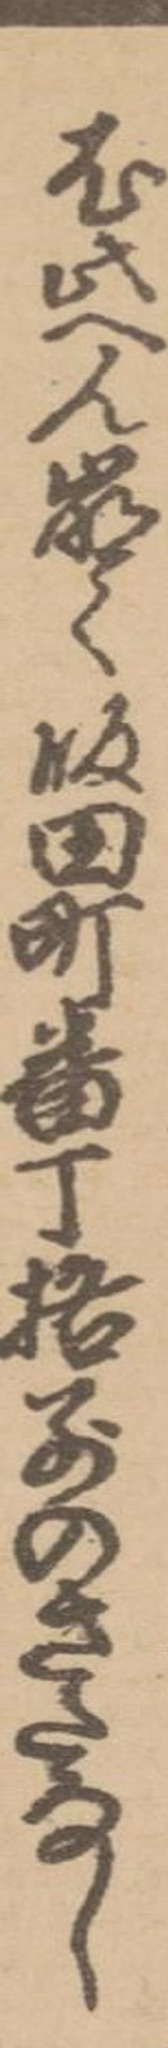尤此へん崩て飯田町番丁格前のさたなく
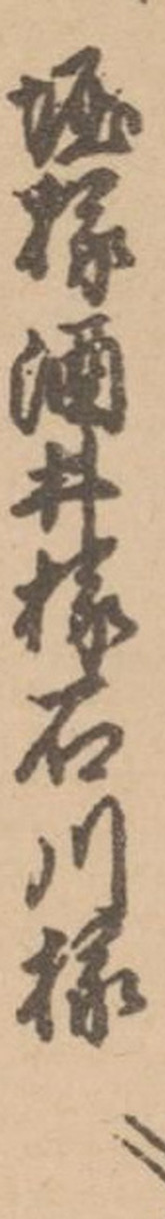堀様酒井様石川様
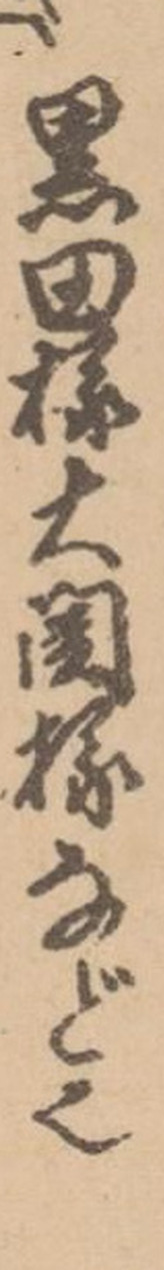黒田様大関様など也
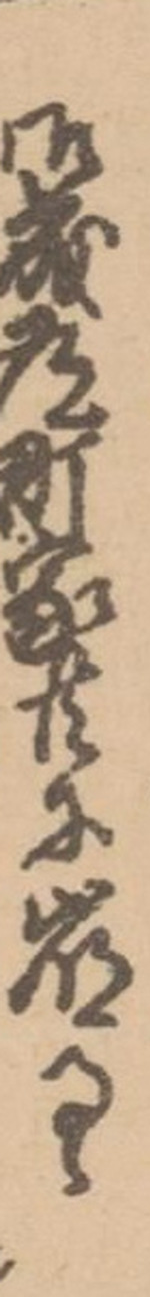御成道町家共に崩るゝ
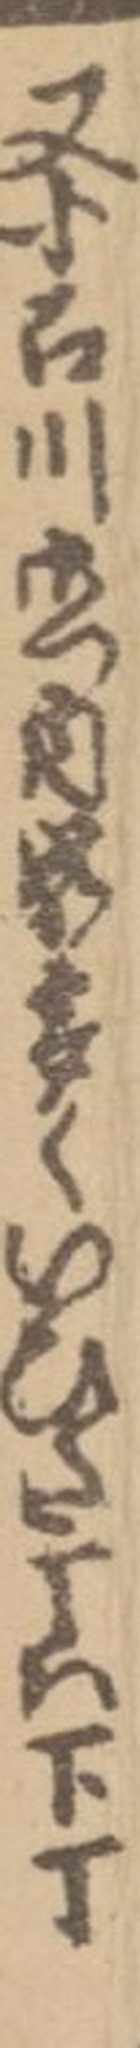又小石川御門内崩多くいひた丁は下丁
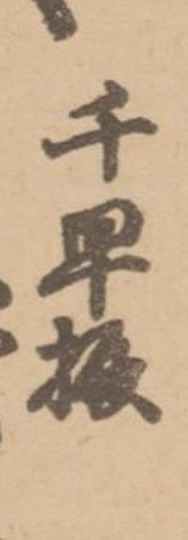千早振
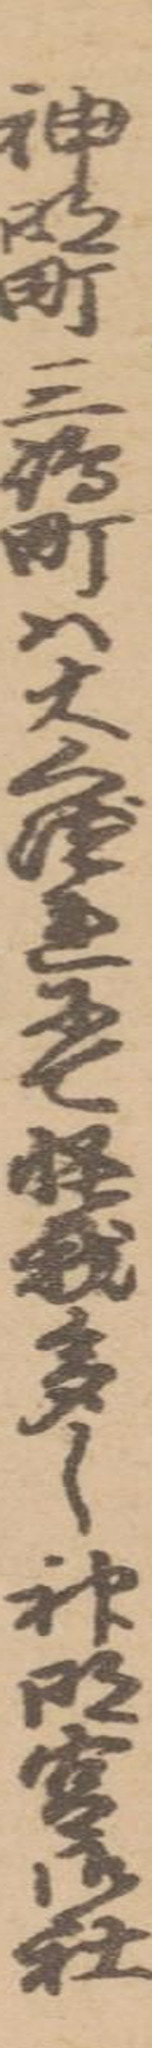神明町三嶋町は大くつれにて怪我多し神明宮御社
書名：安政二卯十月二日大地震附類焼場所
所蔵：東京大学地震研究所図書室 Earthquake Research Institute Library, The University of Tokyo, JAPAN
